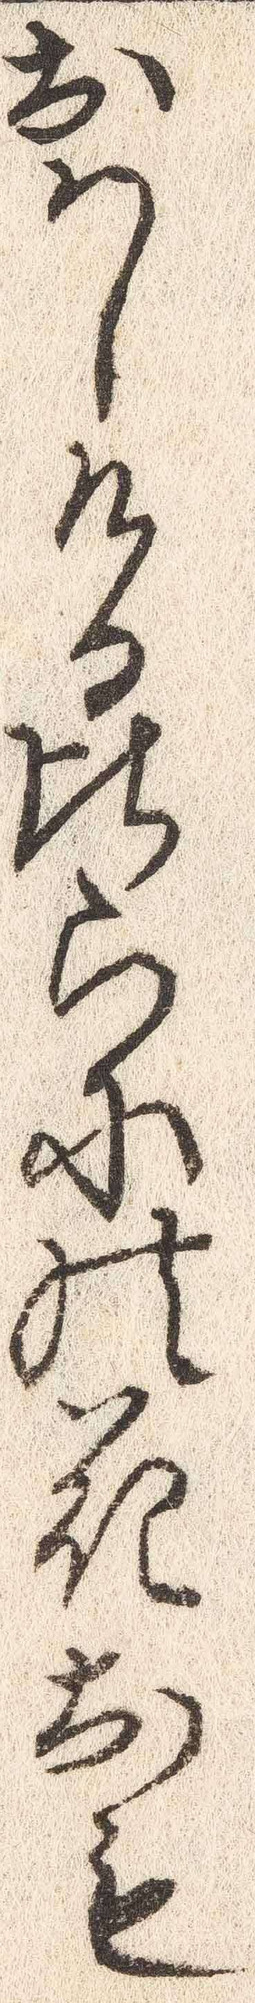おはしける比らにの花おも
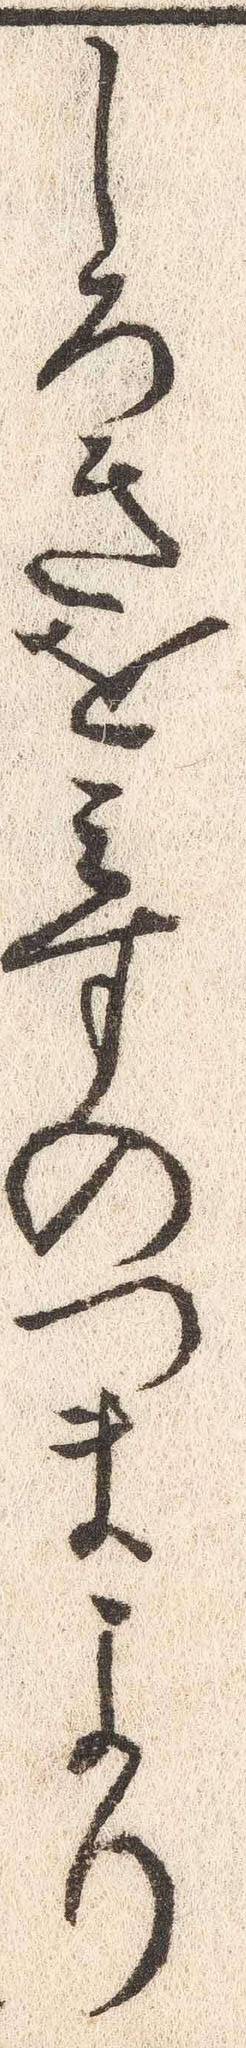しろきをみすのつまより
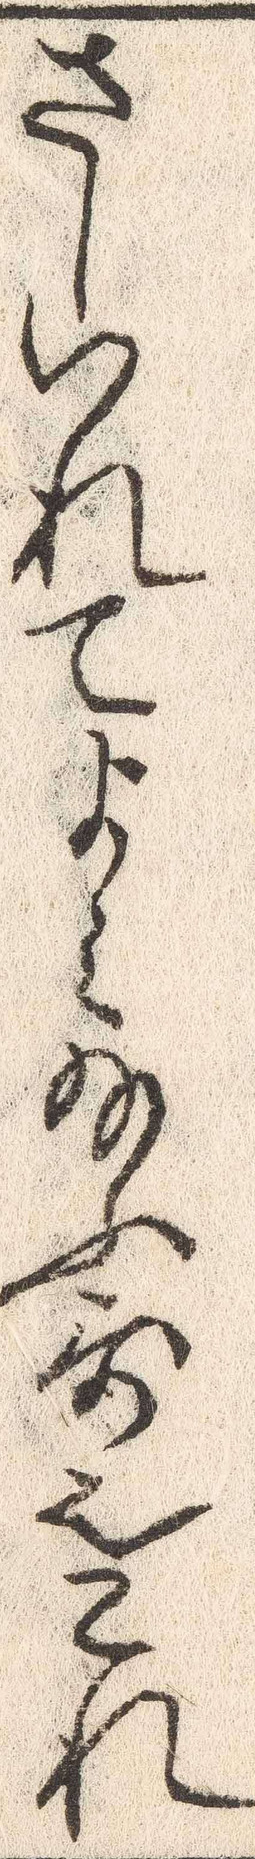さしいれてよみ給ふ歌也これ
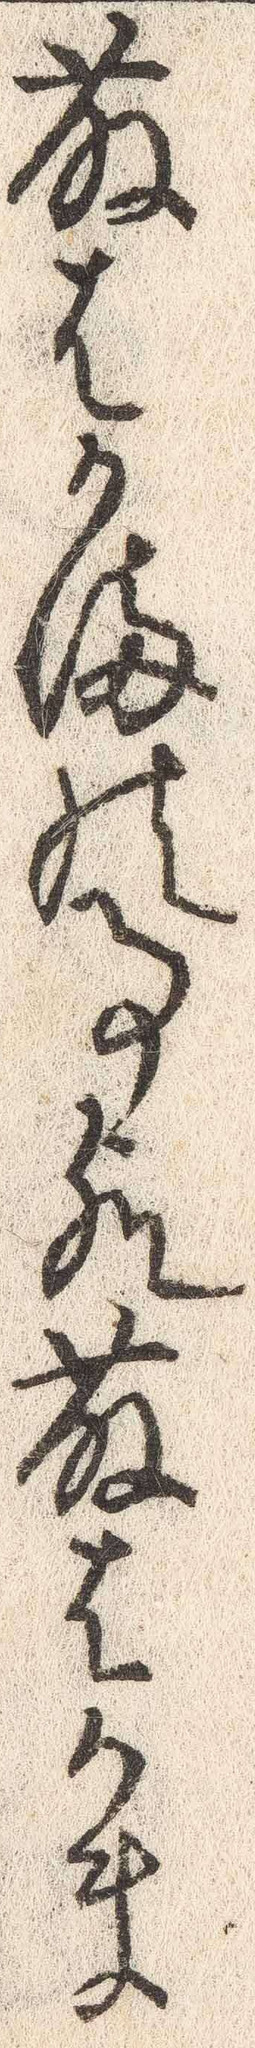藤はかまの事歟藤はかま

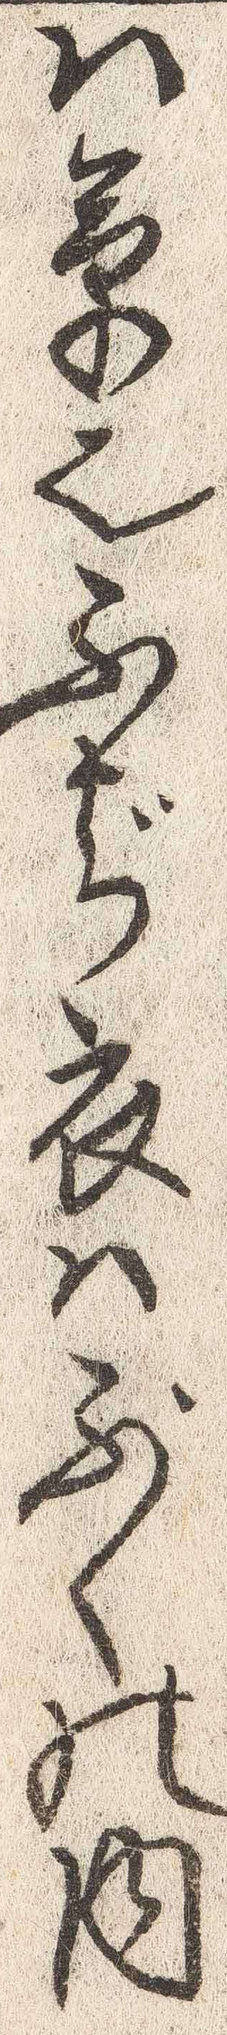は草也ふぢ衣はふくの内
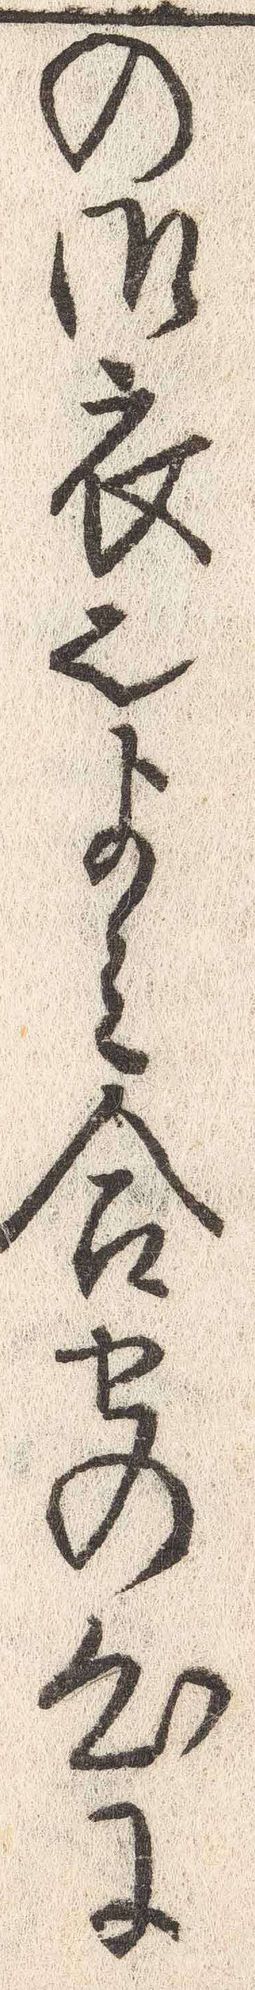の御衣也よみ合せの心に
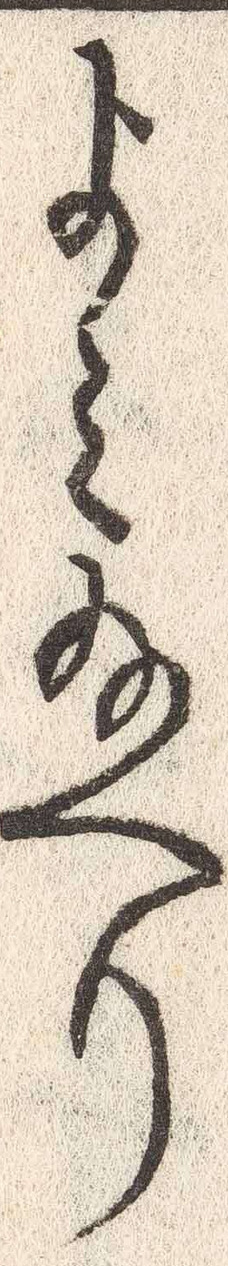よみ給へり
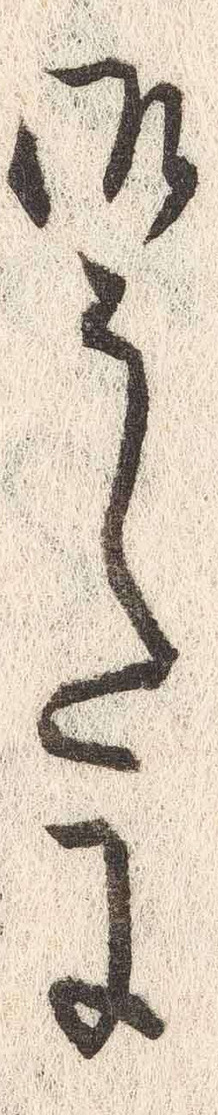御うたに
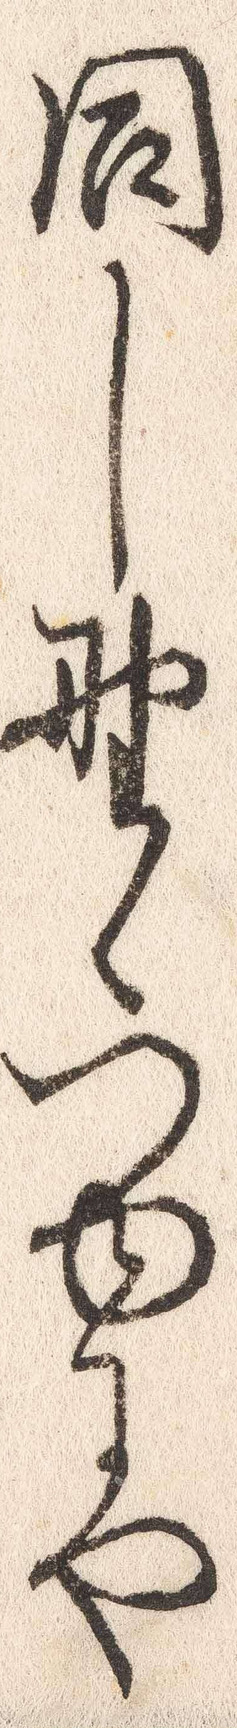同し野ゝつゆにや
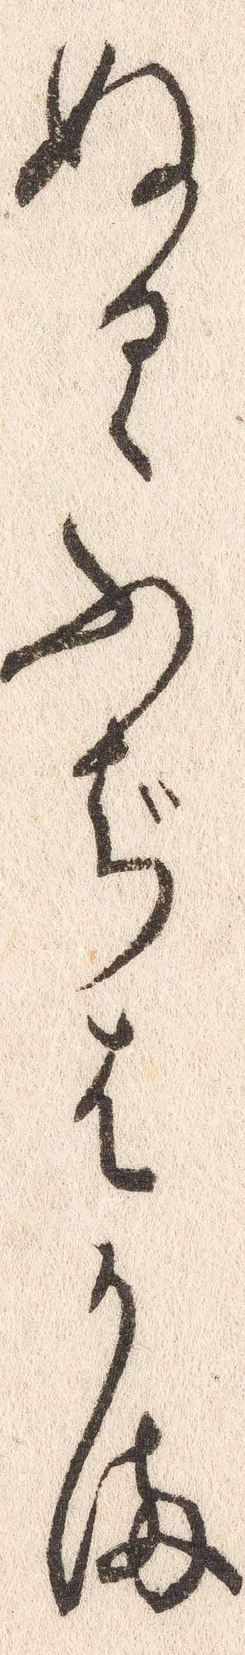ぬるるふぢはかま
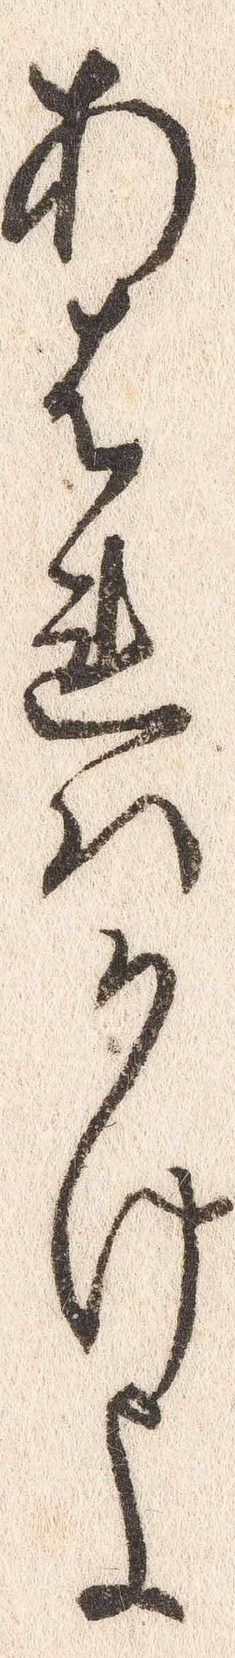あはれはかけよ
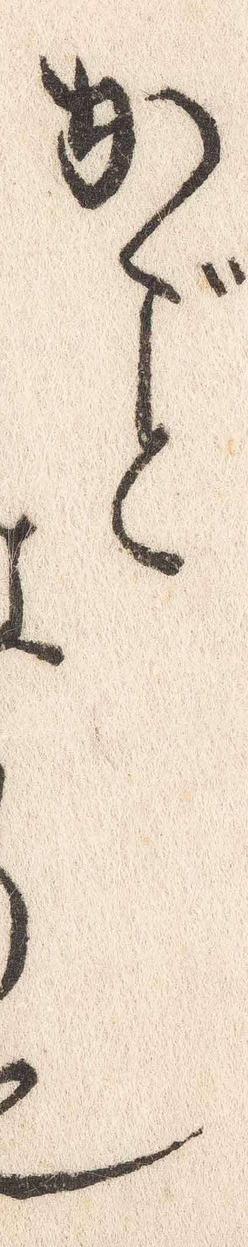かごと
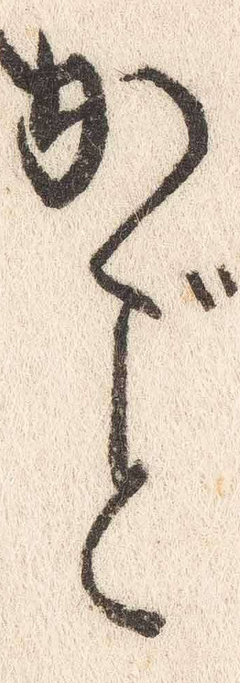かごと
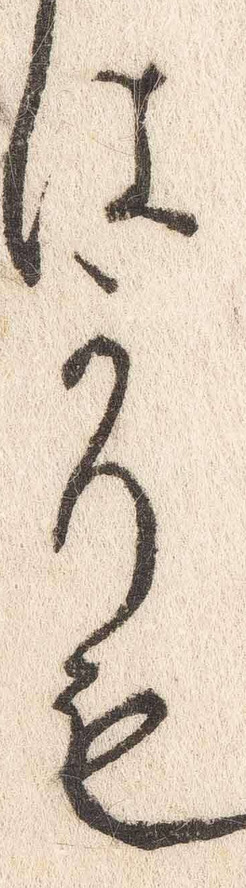はかりも

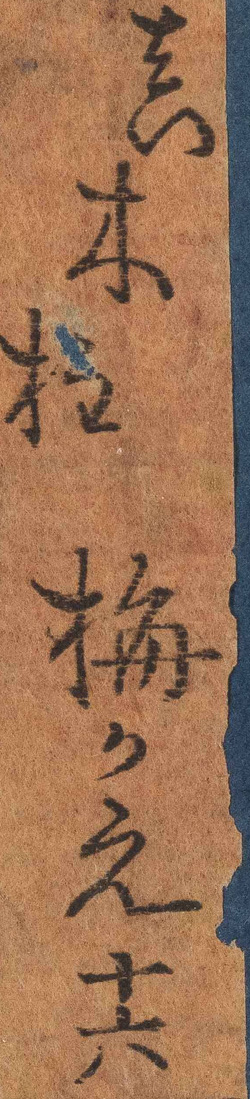真木柱梅かえ十六

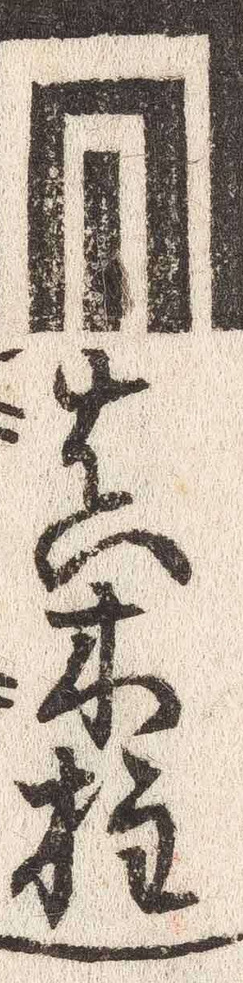真木柱
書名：源氏物語
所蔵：東京学芸大学附属図書館 国文学研究資料館
